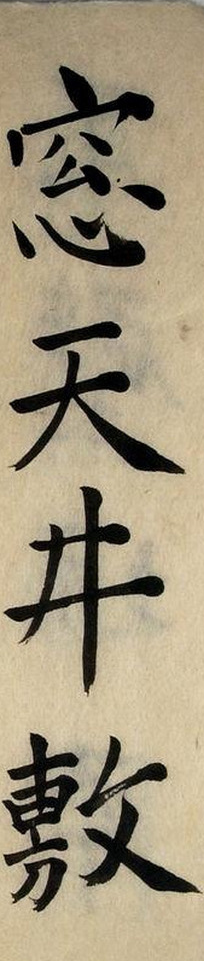窓天井敷
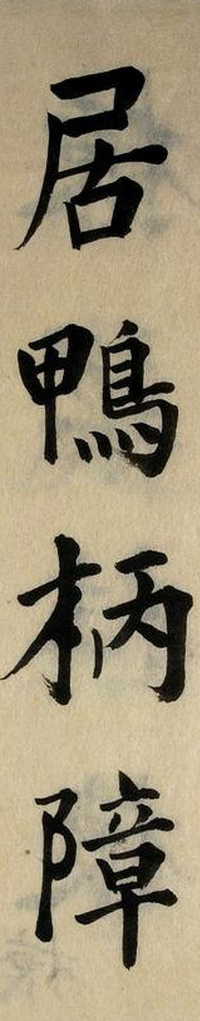居鴨柄障

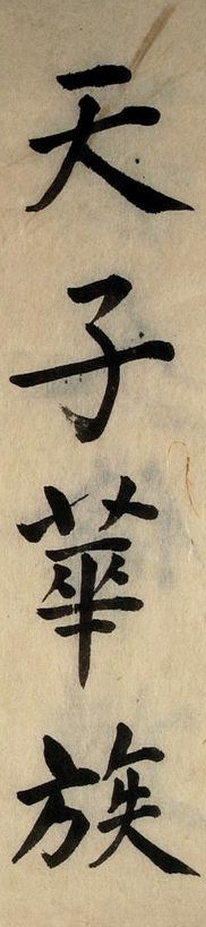天子華族
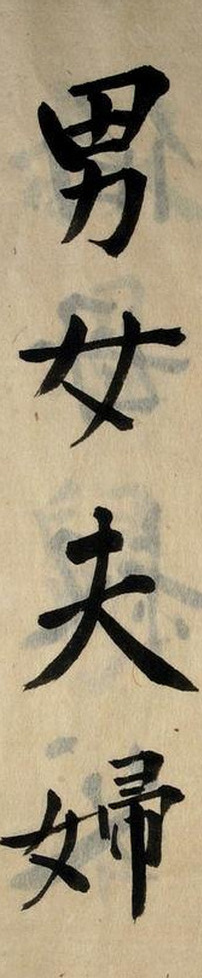男女夫婦
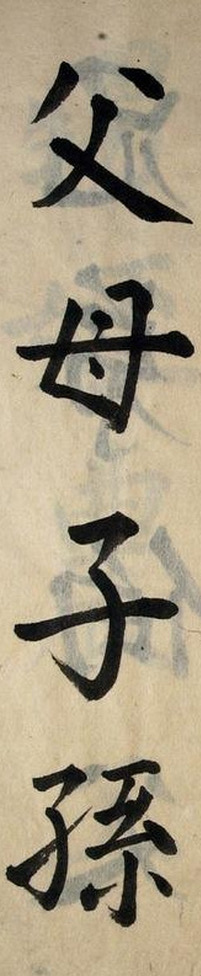父母子孫

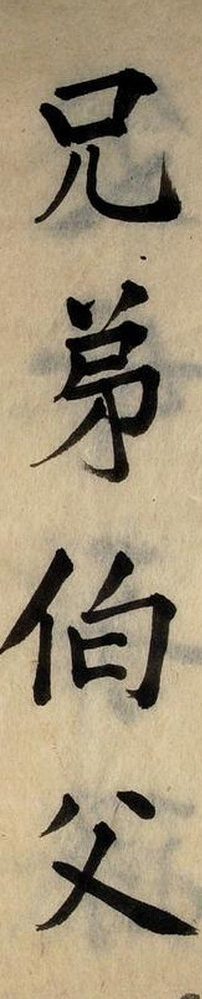兄弟伯父
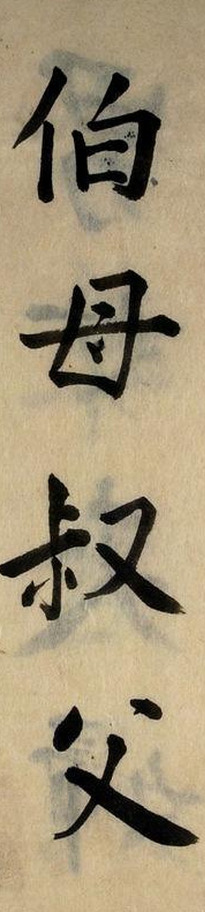伯母叔父
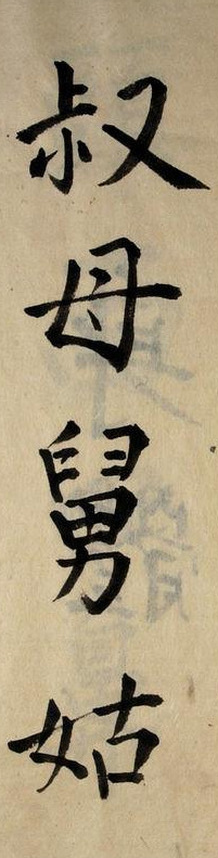叔母舅姑
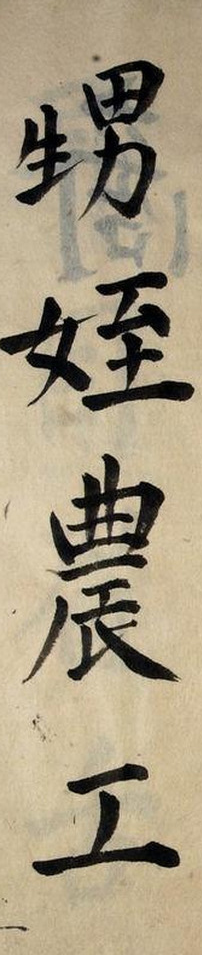甥姪農工

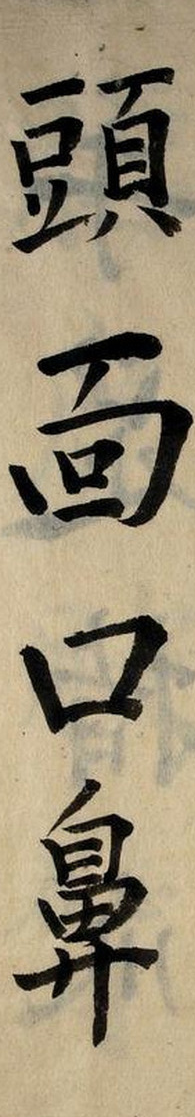頭靣口鼻
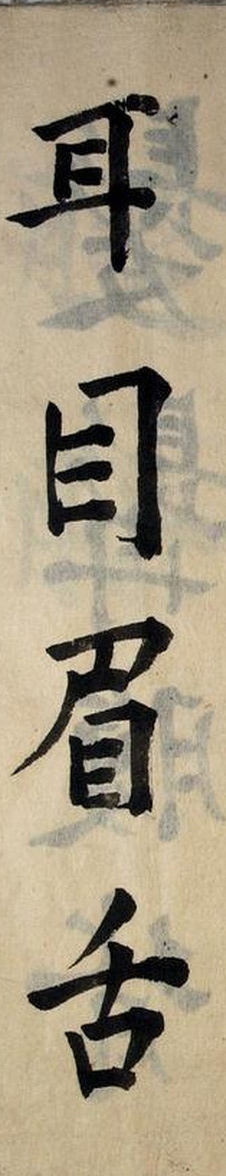耳目眉舌

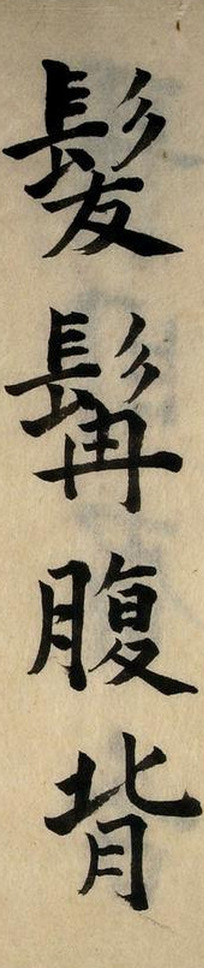髪髯腹背
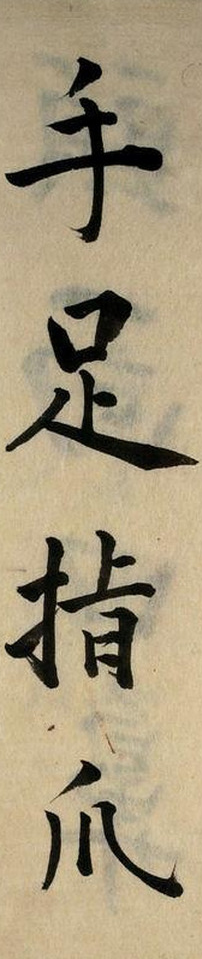手足指爪
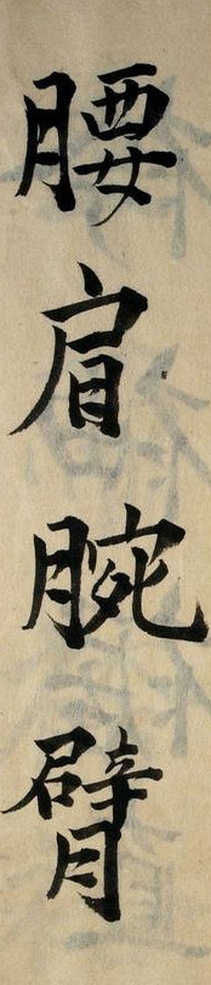腰肩腕臂

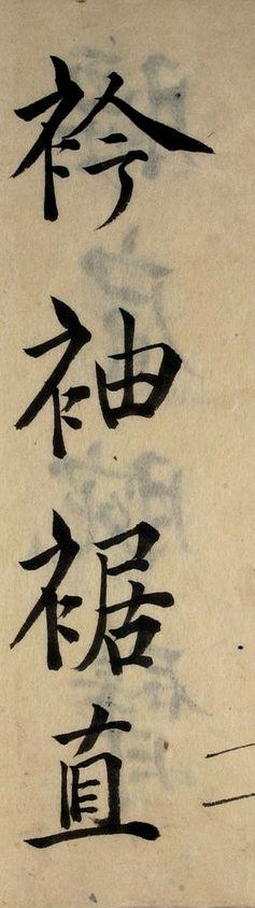衿袖裾直
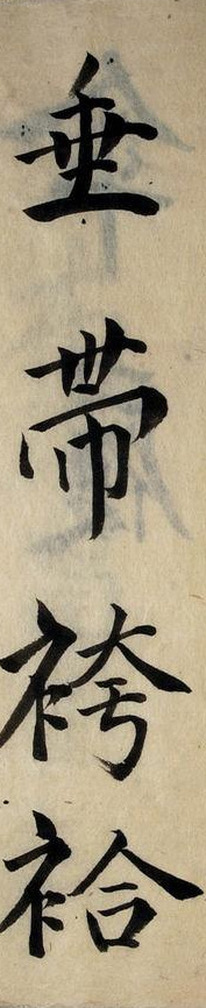垂帯袴袷
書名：御手本（手習）
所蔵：福井県文書館 Fukui Prefectural Archives
